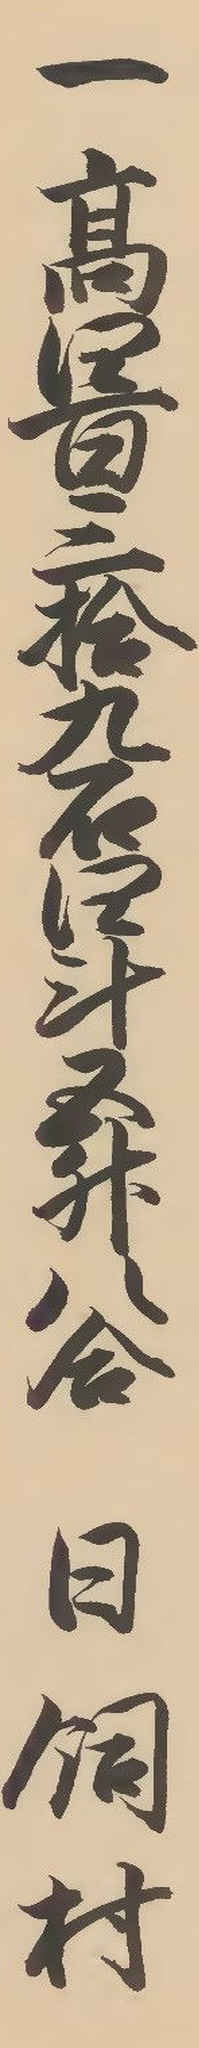一髙四百三拾九石四斗五升八合日飼村

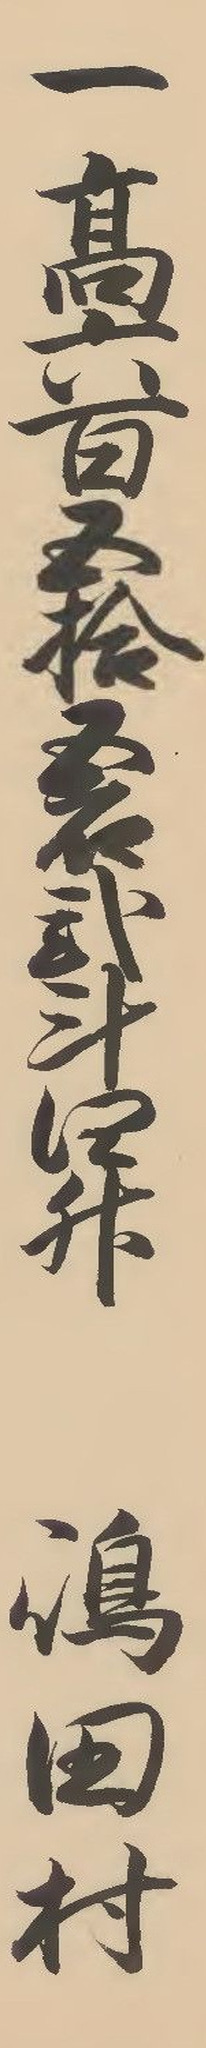一髙六百五拾五石弐斗四升嶋田村
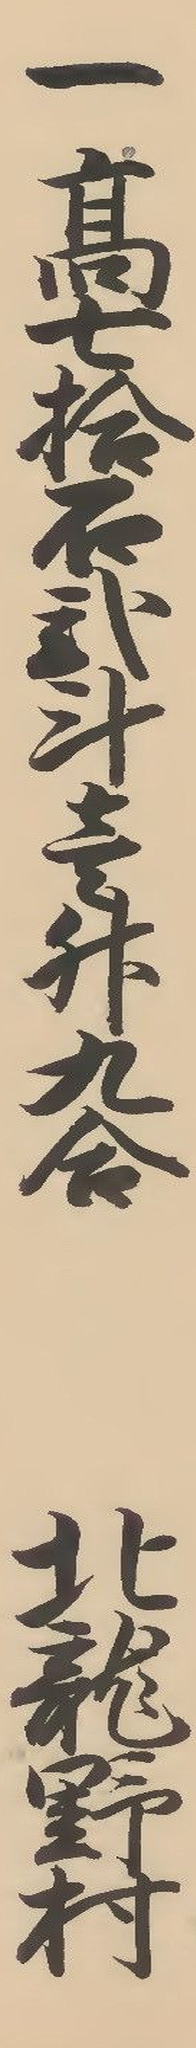一髙七拾石弐斗壱升九合北龍野村
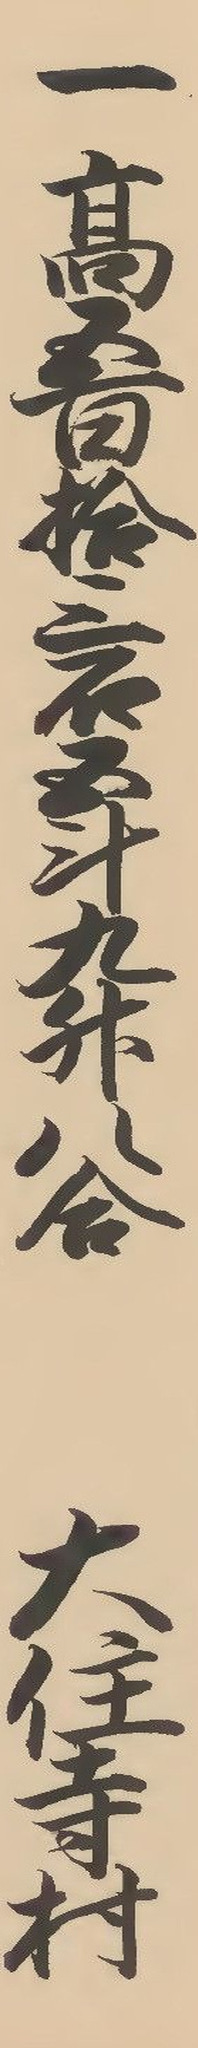一髙五百拾三石五斗九升八合大住寺村
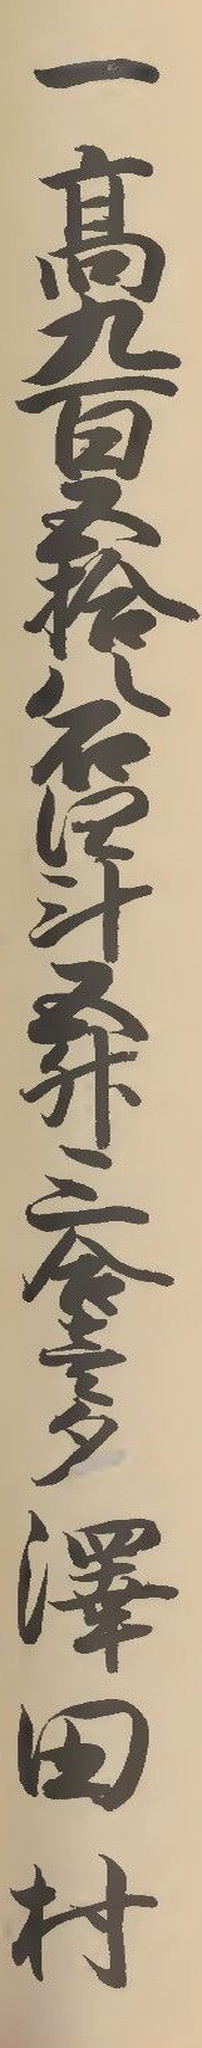一髙九百五拾八石四斗五升三合壱夕澤田村
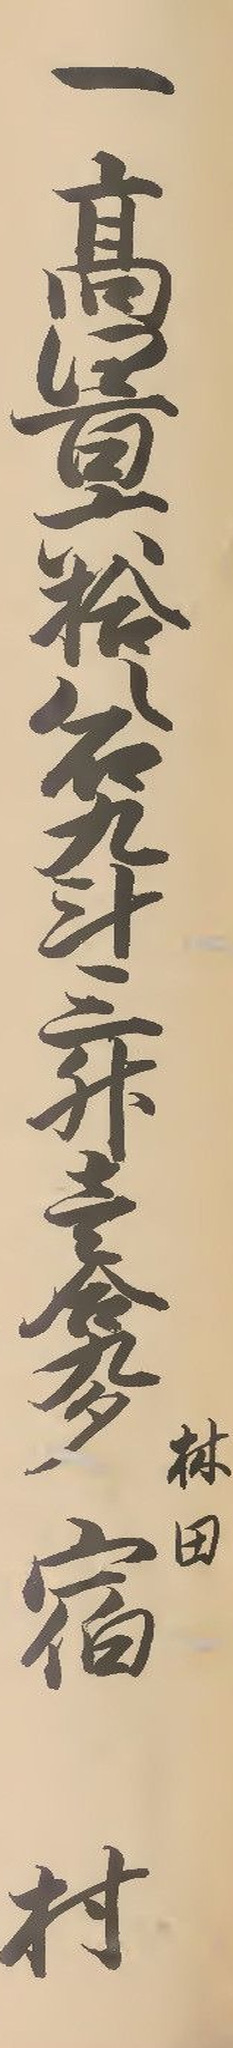一髙四百六拾八石九斗三升壱合九夕宿村
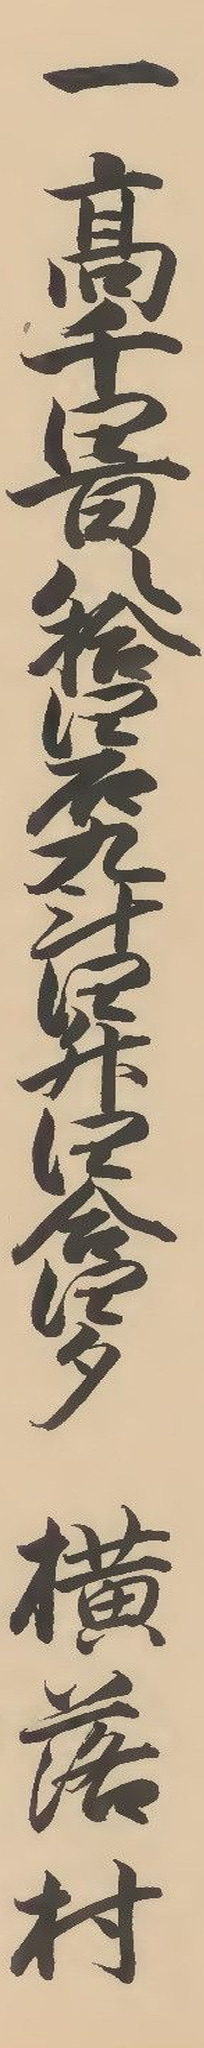一髙千四百八拾四石九斗四升四合四夕横落村
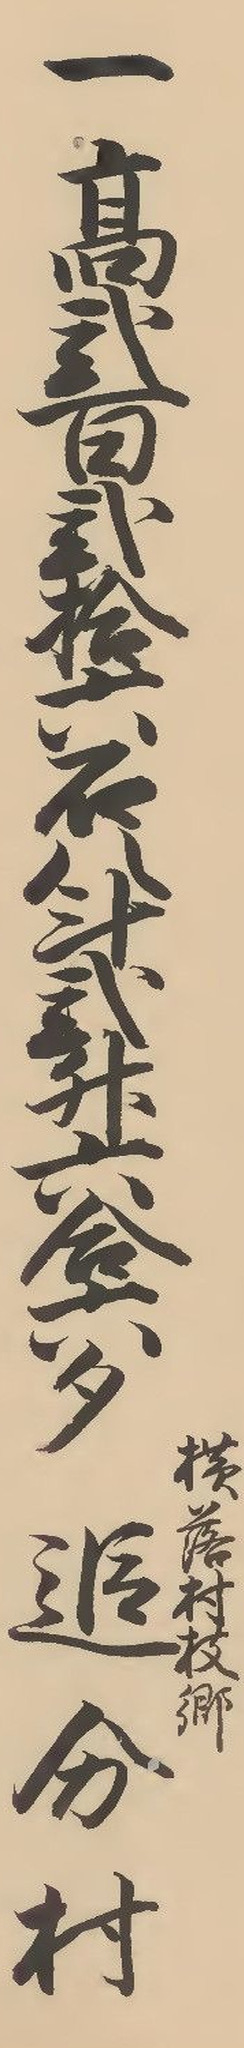一髙弐百弐拾六石八斗弐升六合六夕追分村
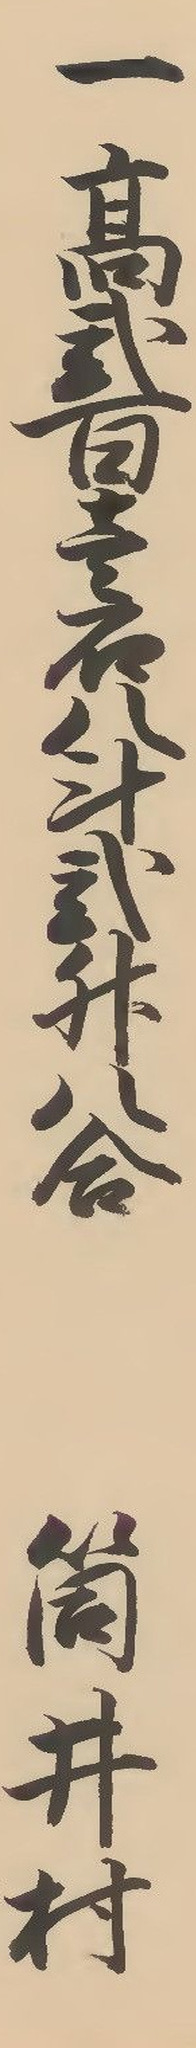一髙弐百壱石八斗弐升八合筒井村

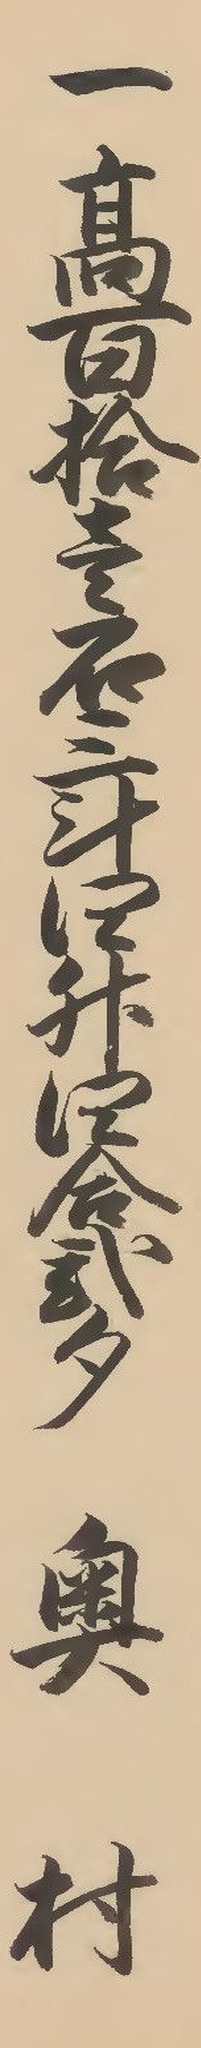一髙百拾壱石三斗四升四合弐夕奥村
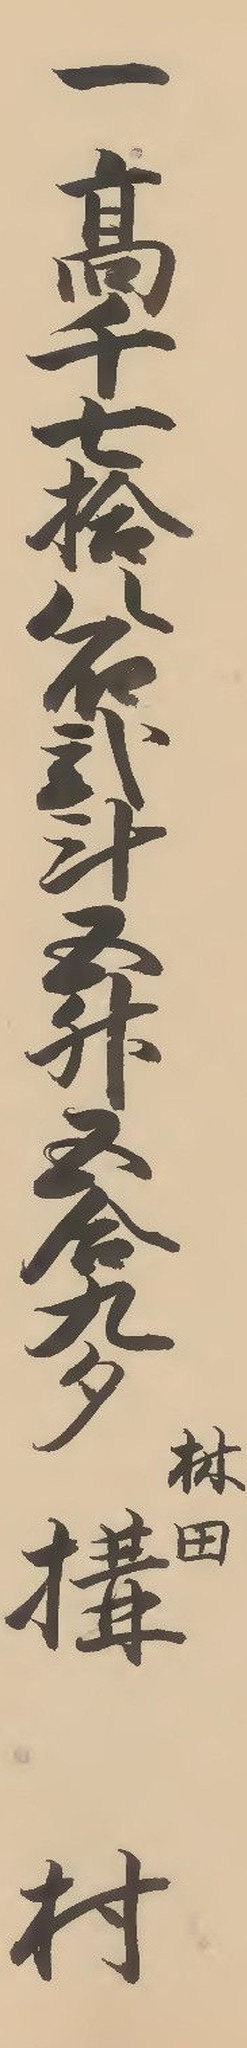一髙千七拾八石弐斗五升五合九夕構村
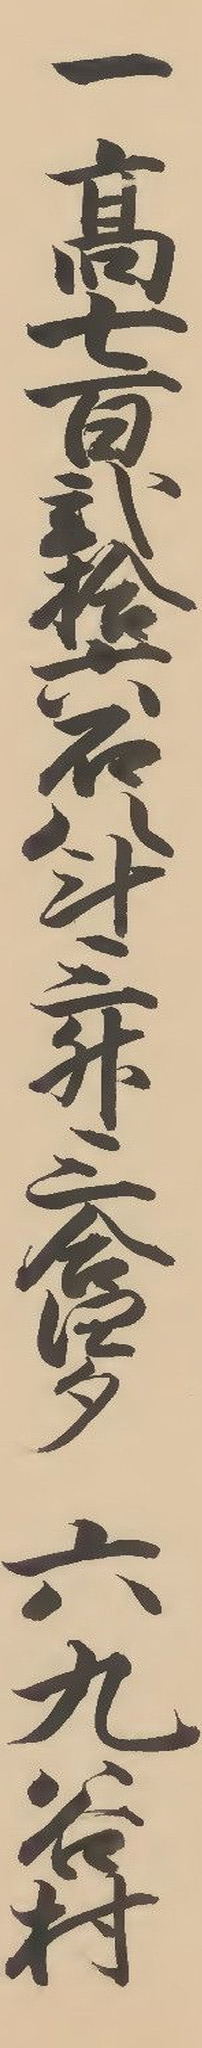一髙七百弐拾六石八斗三升三合四夕六九谷村
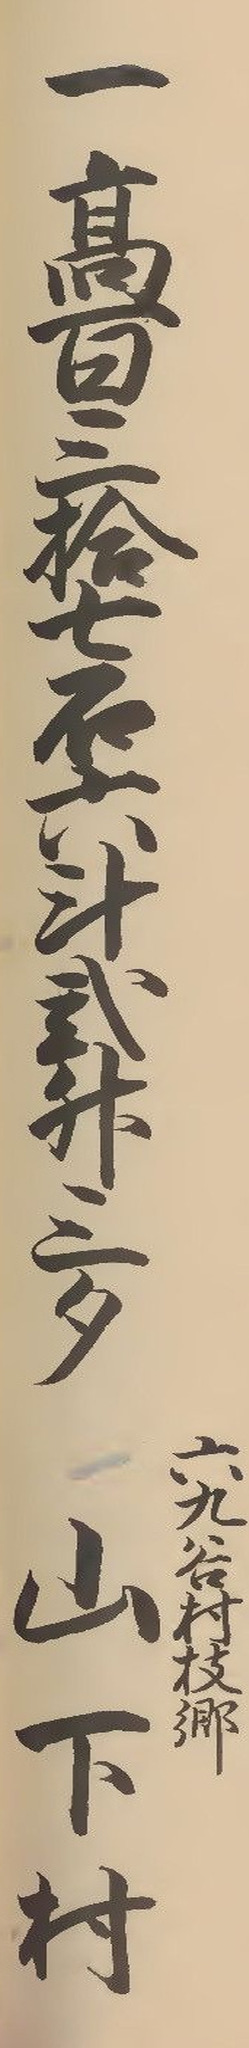一髙百三拾七石六斗弐升三夕山下村
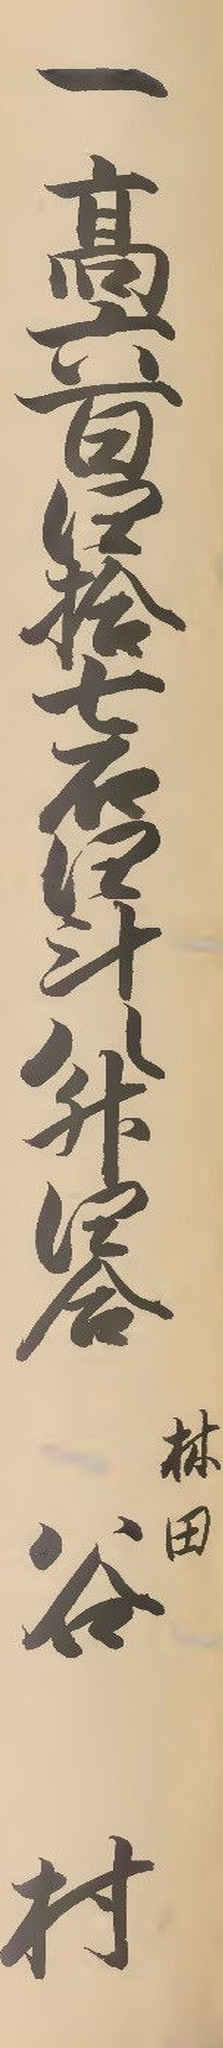一髙六百四拾七石四斗八升四合谷村
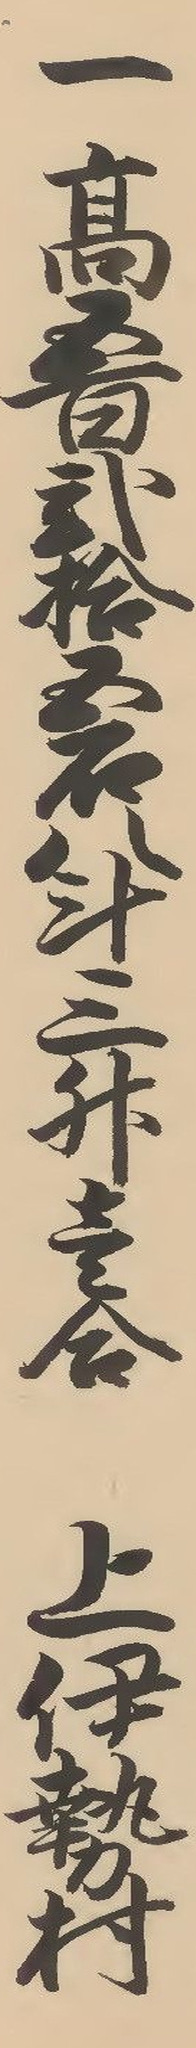一髙五百弐拾五石八斗三升壱合上伊勢村
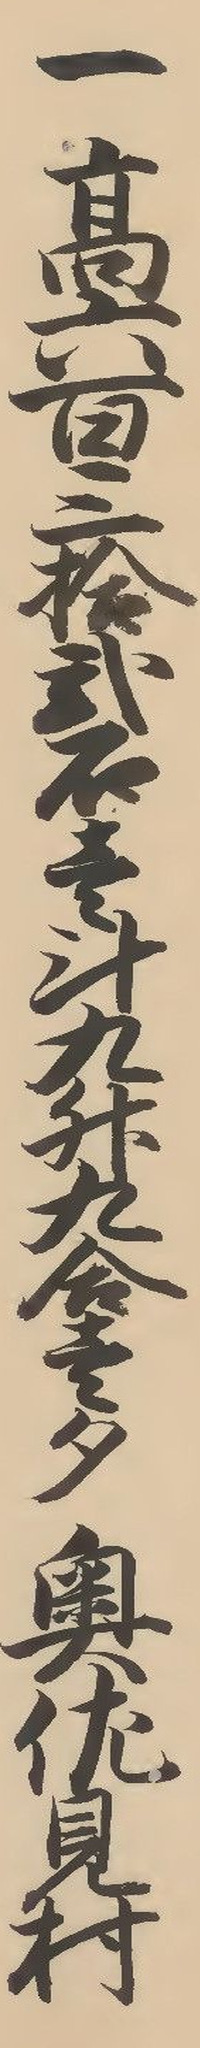一髙六百三拾弐石壱斗九升九合壱夕奥佐見村
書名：播磨国郷帳
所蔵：国立公文書館 National Archives of Japan
